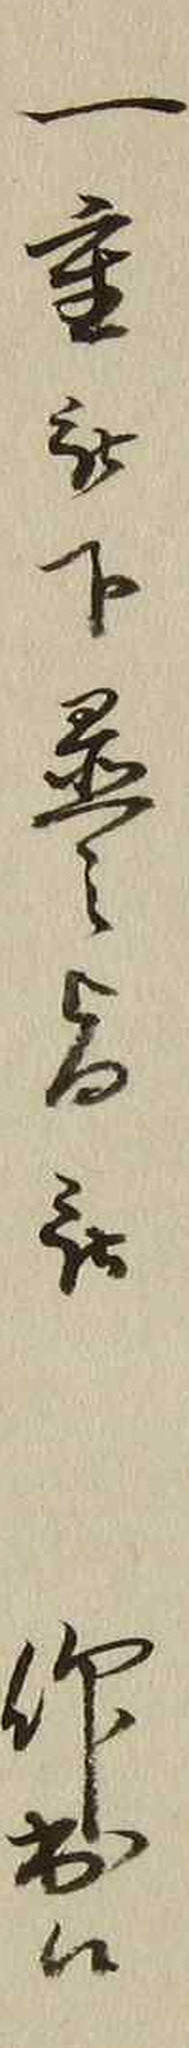一重被下置之旨被仰出候
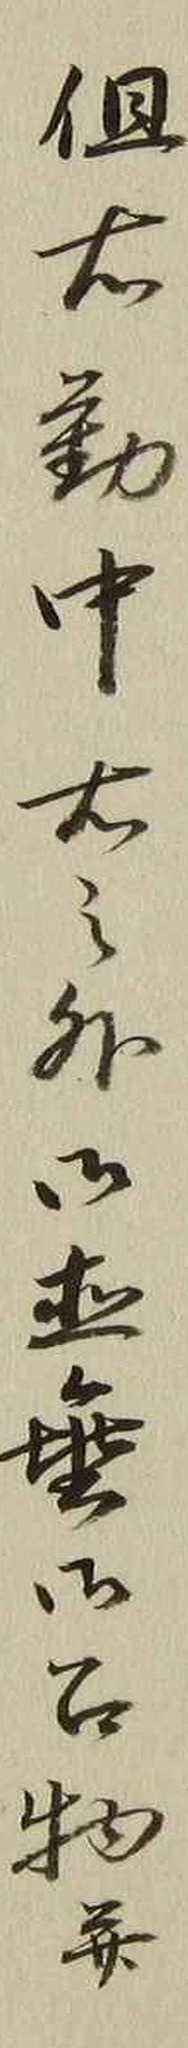但右勤中右之外御直垂御召物并
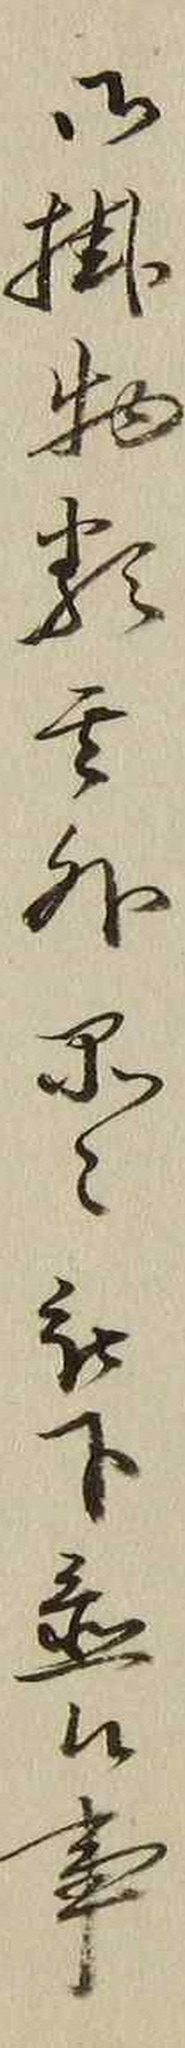御掛物類其外品々被下置候事
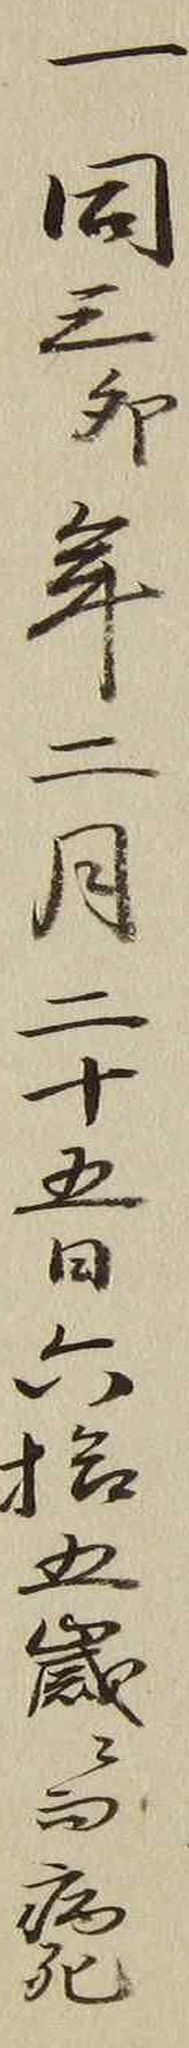一同三卯年二月二十五日六拾五歳に而病死
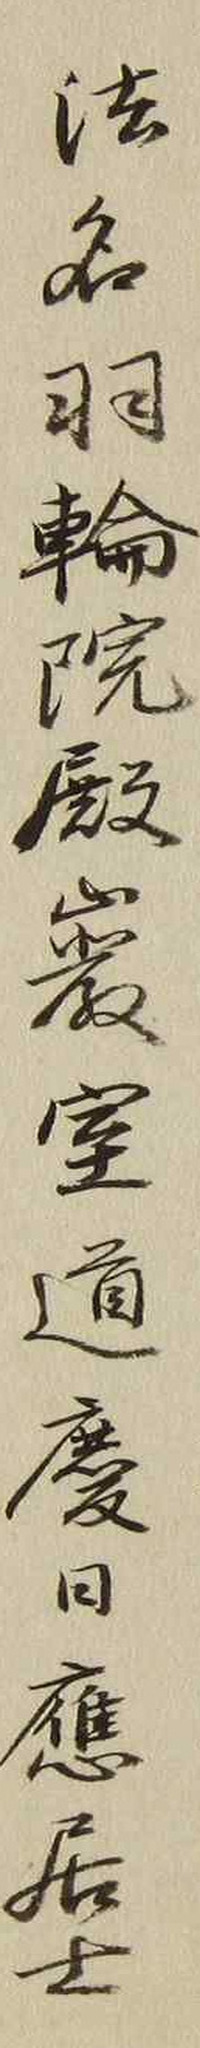法名羽輪院殿巖室道慶日応居士
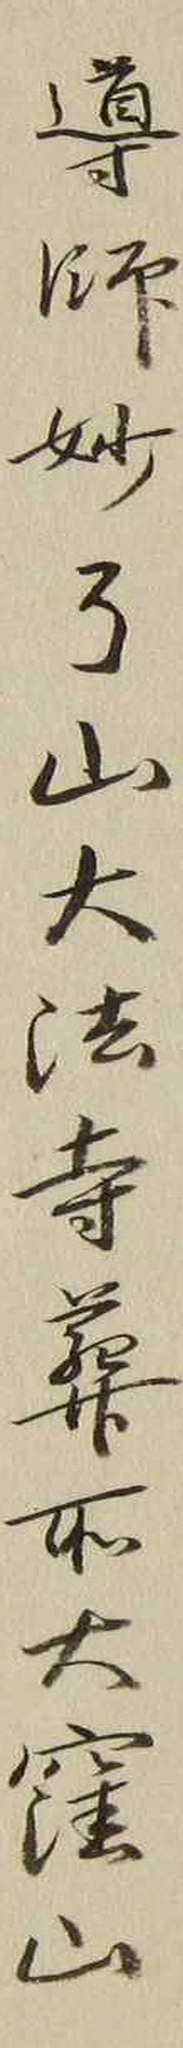導師妙了山大法寺葬所大窪山

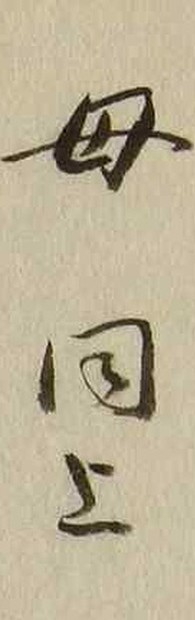母同上
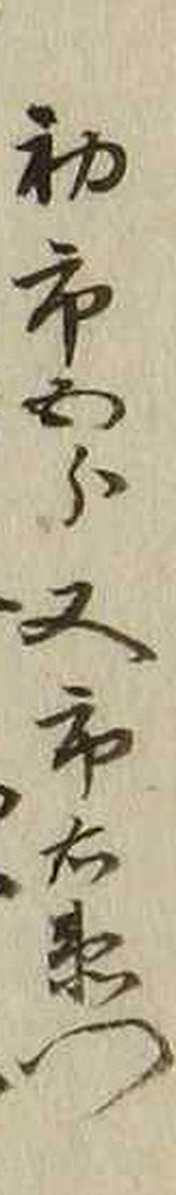初市五郎又右衛門
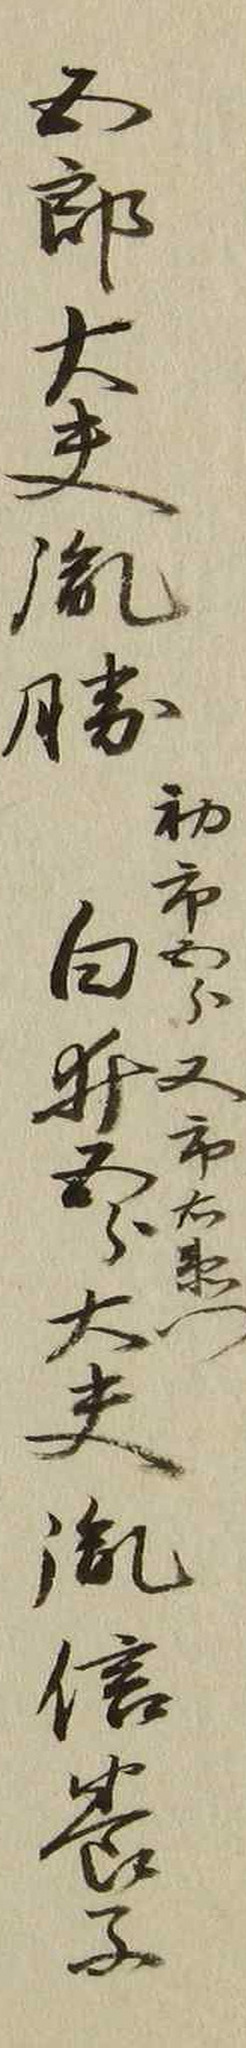五郎大夫胤勝白井五郎太夫胤信養子
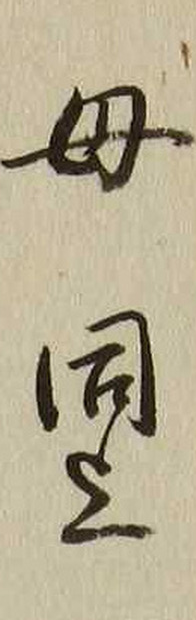母同上
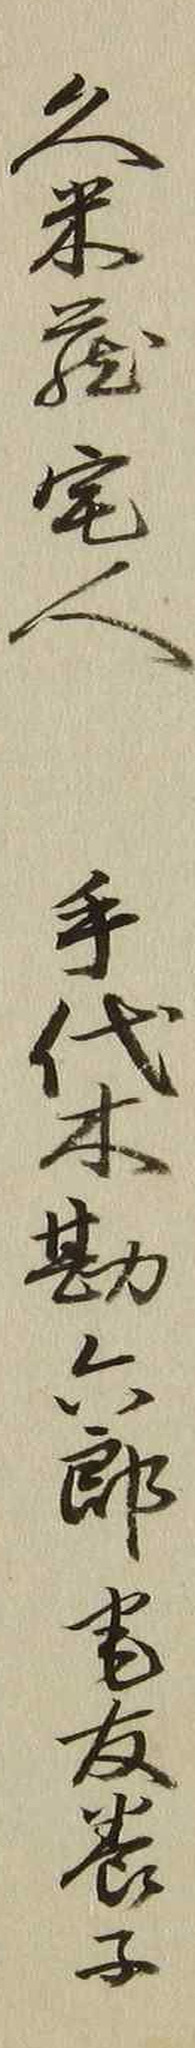久米蔵宅人手代木勘六郎筆友養子
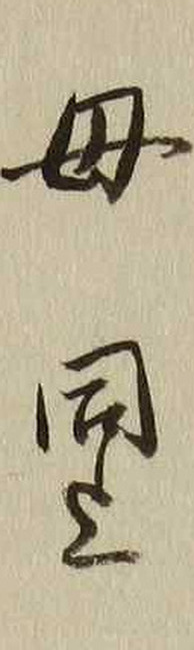母同上
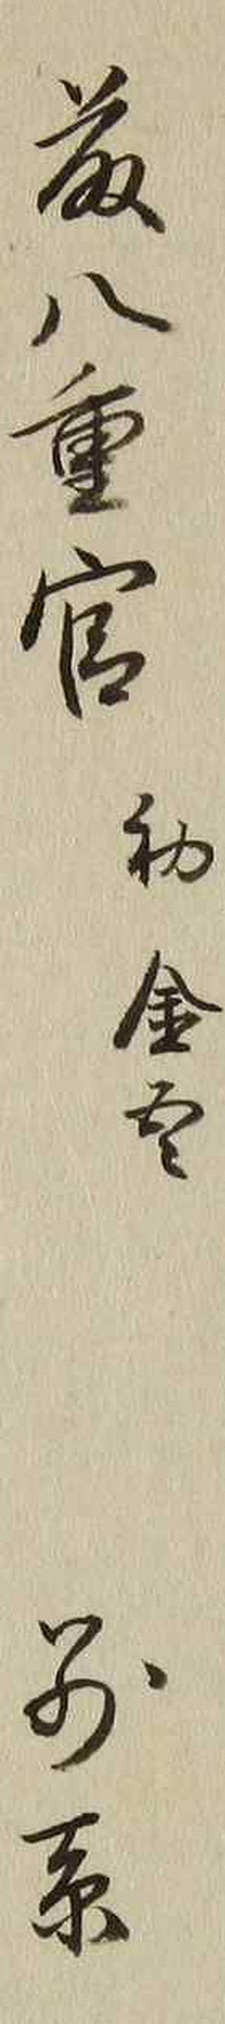藤八重官初金雲別京
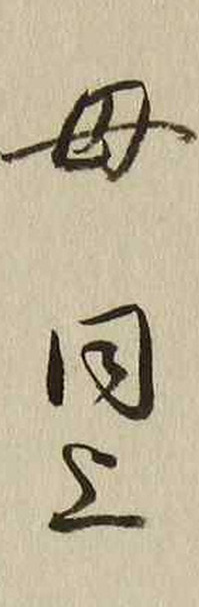母同上
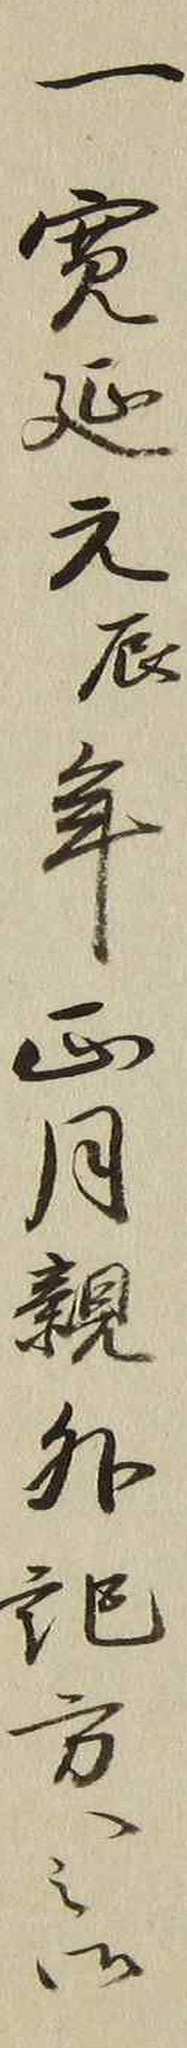一寛延元辰年正月親外記方へ之御
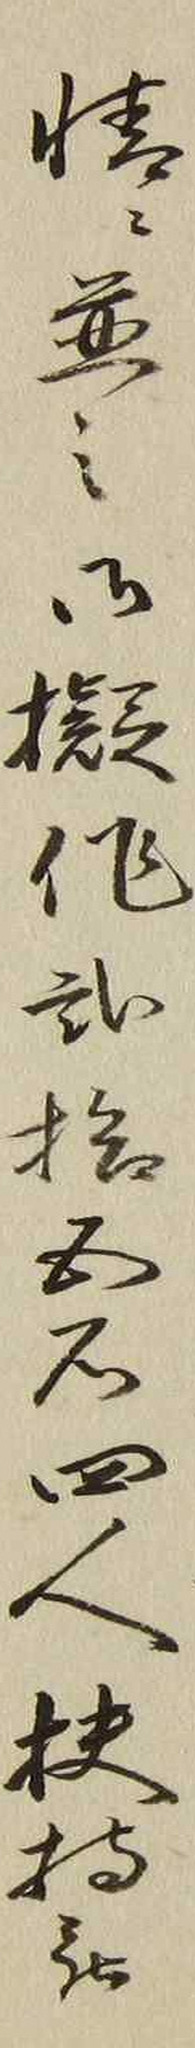情に並之御擬作弐拾五石四人扶持被
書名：諸士系譜　巻之133　た之部9
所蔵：会津若松市立会津図書館
